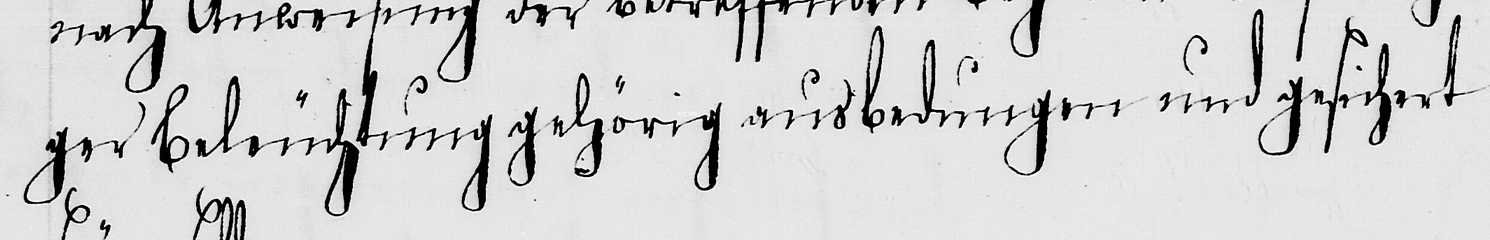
ger Beleuchtung gehörig ausbedungen und gesichert
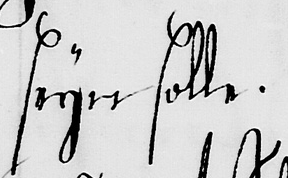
seyn sol¬
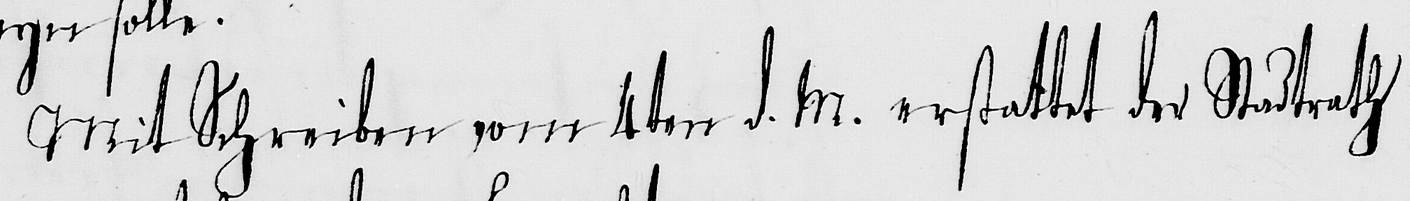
Mit Schreiben vom 4ten d. M. erstattet der Stadtrath
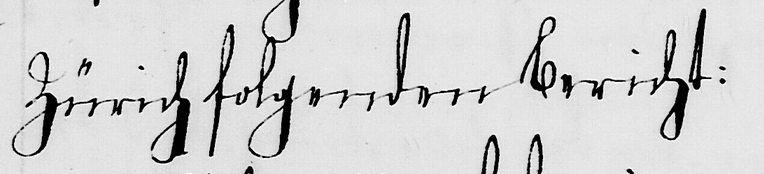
Zürich folgenden Bericht:
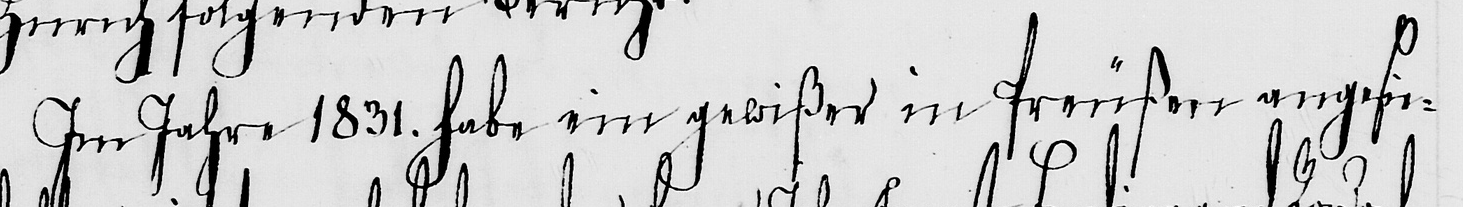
Im Jahre 1831. habe ein gewißer in Preußen angesied¬
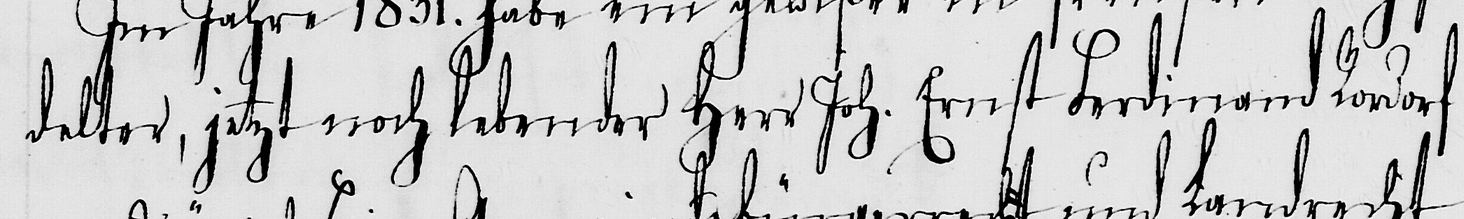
elter, jetzt noch lebender Herr Joh. Ernst Ferdinand Rordo¬
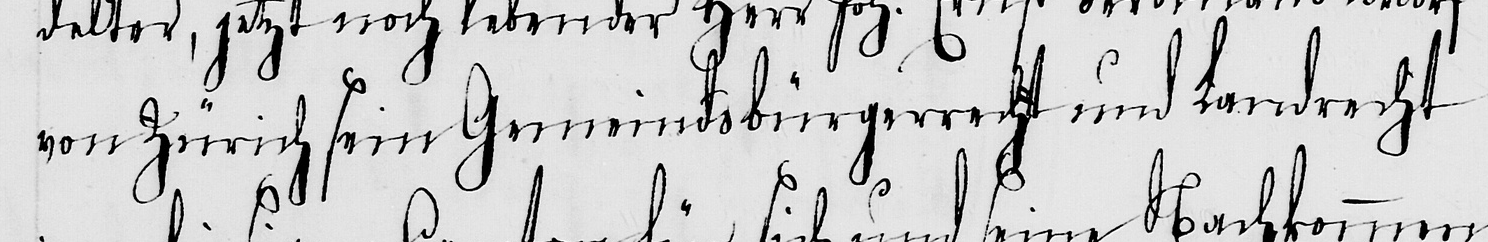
von Zürich sein Gemeindsbürgerrecht und Landrecht
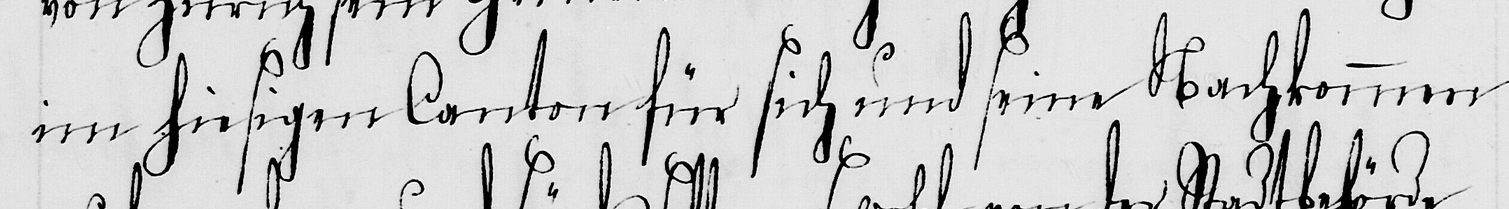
im hiesigen Canton für sich und seine Nachkommen
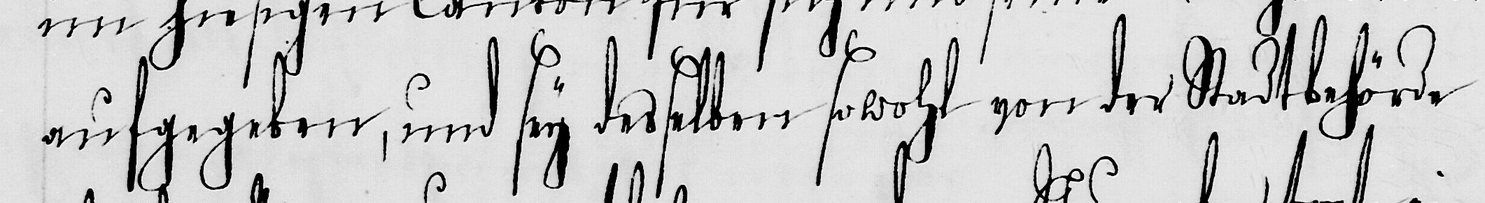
aufgegeben, und sey desselben sowohl von der Stadtbehörde
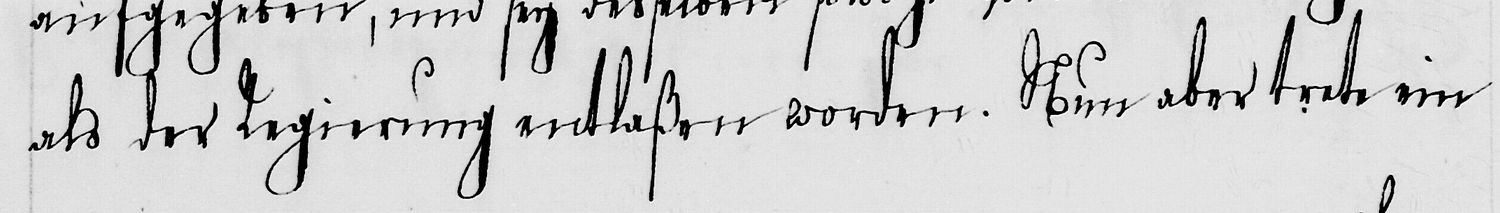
als der Regierung entlaßen worden. Nun aber trete ein
